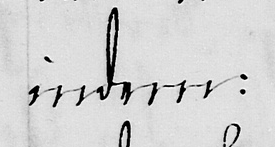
indem:
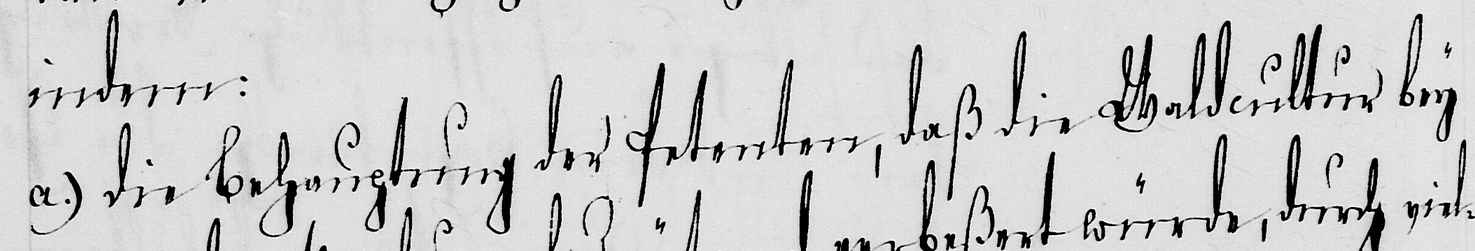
a.) die Behauptung der Petenten, daß die Waldcultur bey
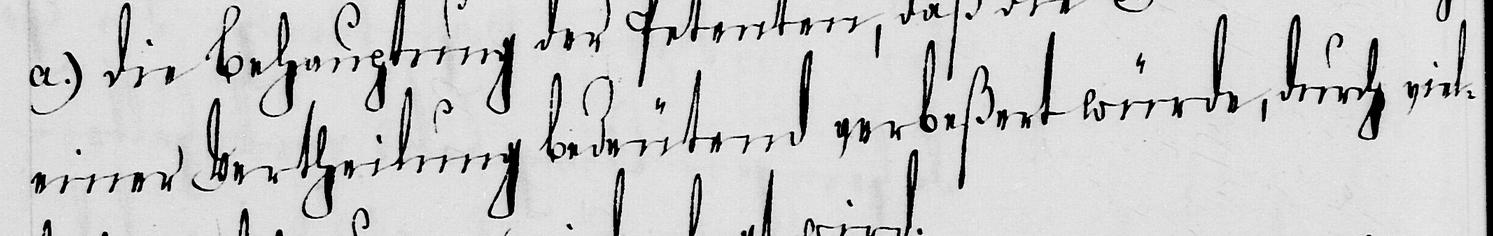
einer Vertheilung bedeutend verbeßert würde, durch vi¬
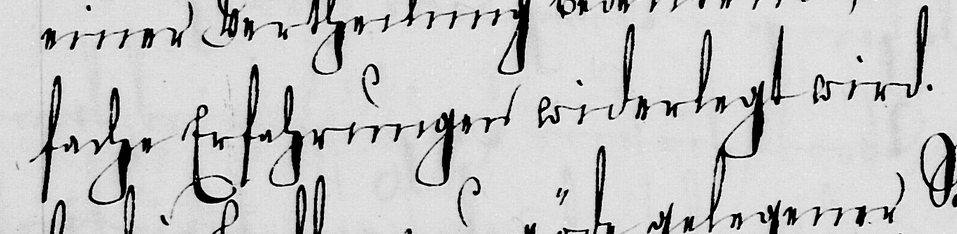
fache Erfahrungen widerlegt wird.
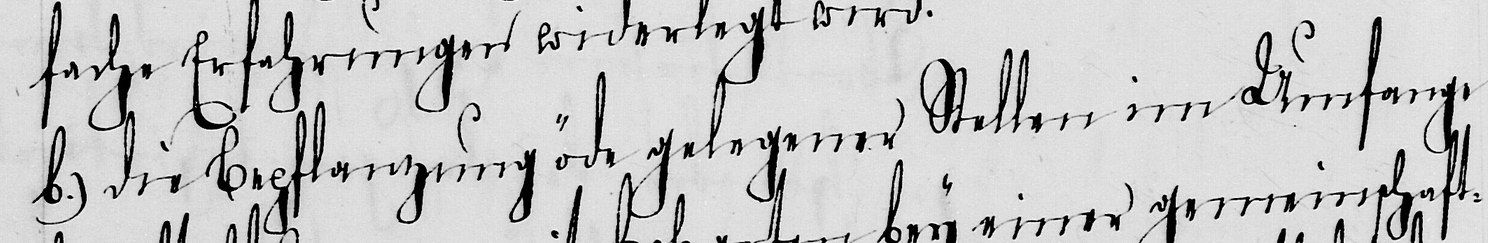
b.) die Bepflanzung öde gelegener Stellen im Umfange
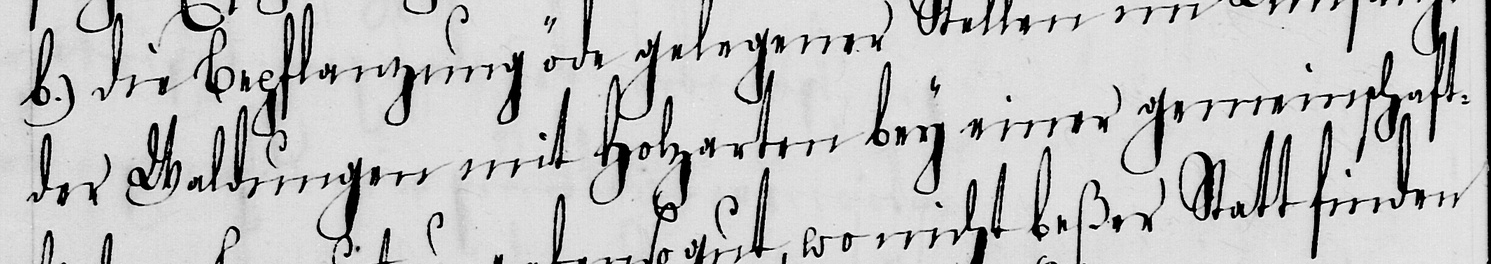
der Waldungen mit Holzarten bey einer gemeinschaft¬
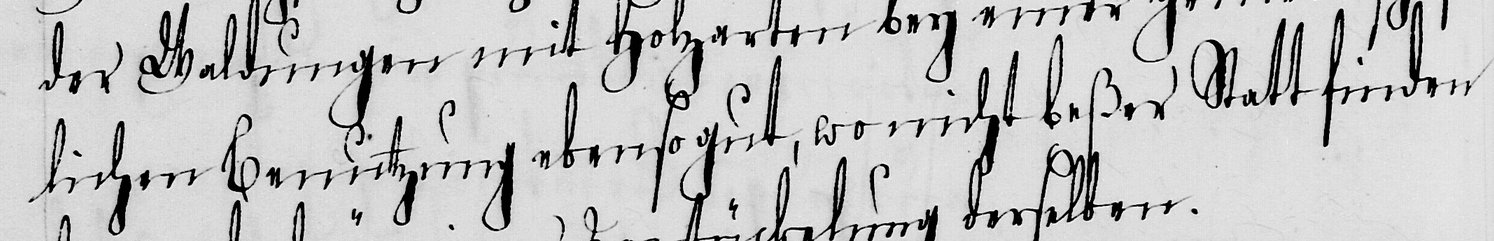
lichen Benutzung ebenso gut, wo nicht beßer Statt finden
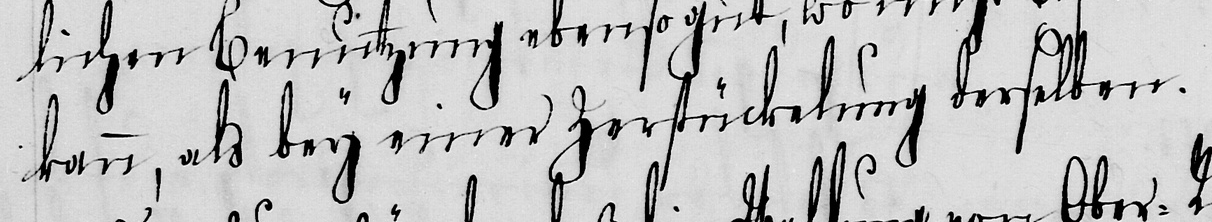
kann, als bey einer Zerstückelung derselben.
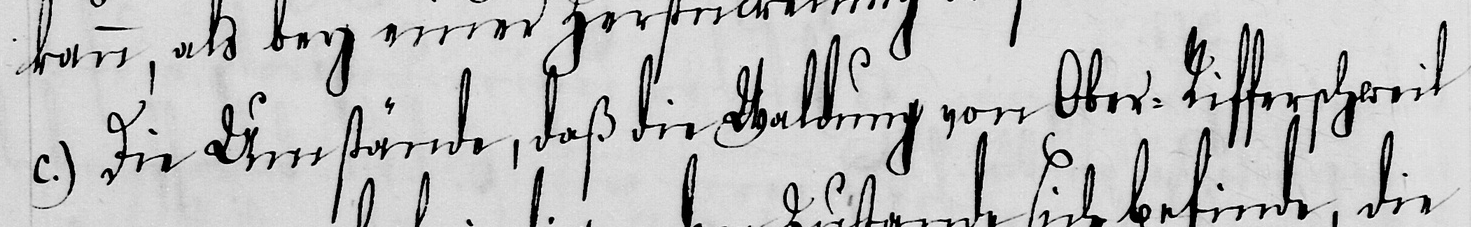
c.) Die Umstände, daß die Waldung von Ober-Rifferschwe¬
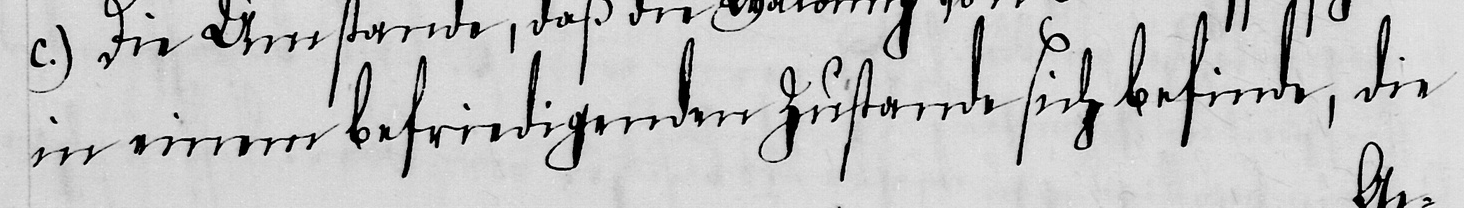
in einem befriedigenden Zustande sich befinde, die
